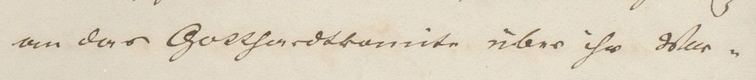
an das Gotthardtkomite über ihr Vor-
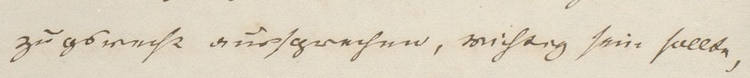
zugsrecht aussprechen, richtig sein sollte,
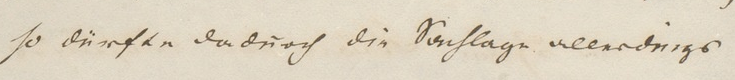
so dürfte dadurch die Sachlage allerdings
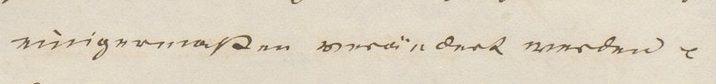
einigermaßen verändert werden &
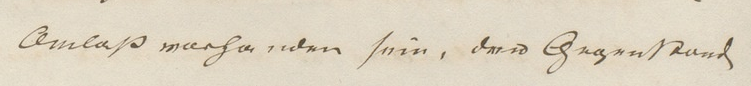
Anlaß vorhanden sein, den Gegenstand
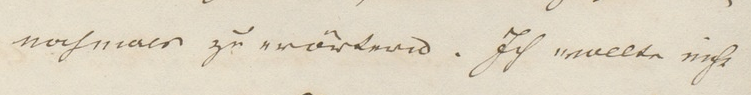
nochmals zu erörtern. Ich wollte nicht
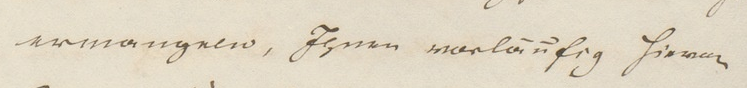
ermangeln, Ihnen vorläufig hievon
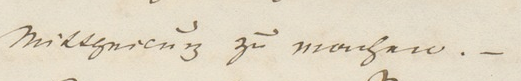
Mittheilung zu machen. –
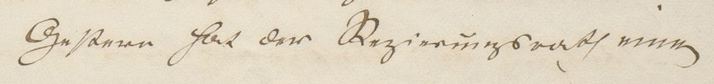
Gestern hat der Regierungsrath eine
